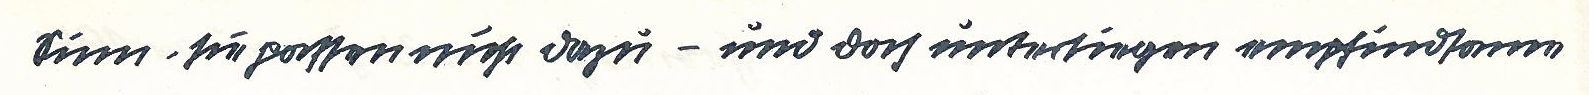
Sinn, sie passen nicht dazu – und doch unterliegen empfindsame
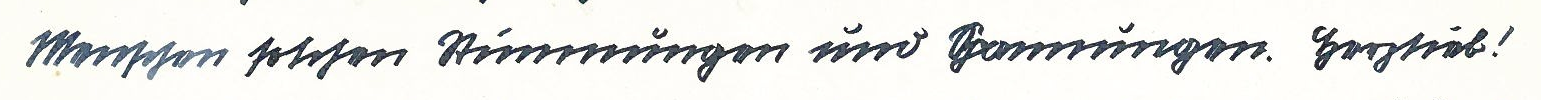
Menschen solchen Stimmungen und Spannungen. Herzlieb!
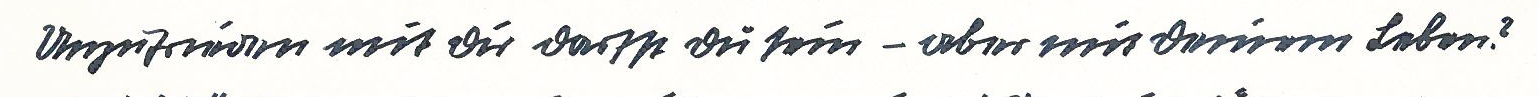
Unzufrieden mit Dir darfst Du sein – aber mit Deinem Leben?
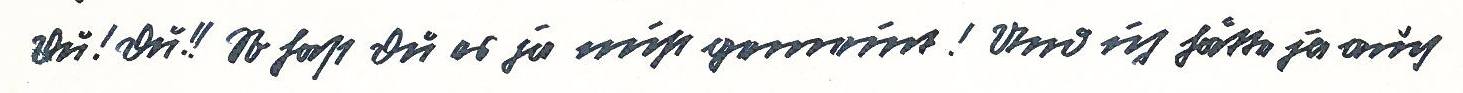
Du! Du!! So hast Du es ja nicht gemeint! Und ich hätte ja auch
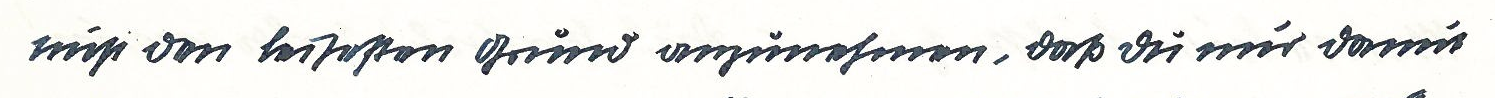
nicht den leisesten Grund anzunehmen, daß Du mir damit
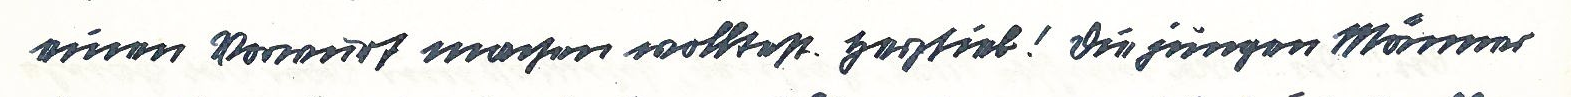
einen Vorwurf machen wolltest. Herzlieb! Die jungen Männer
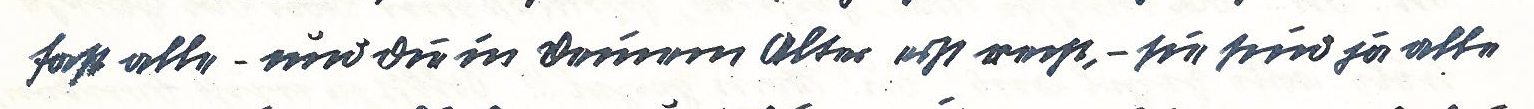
fast alle – und die in Deinem Alter erst recht, – o, sie sind ja alle
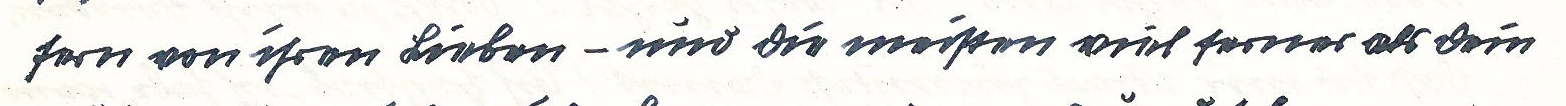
fern von ihren Lieben – und die meisten viel ferner als Dein
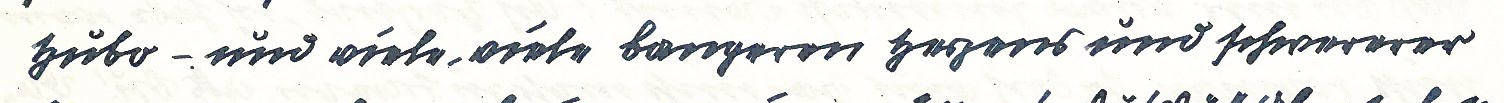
Hubo – und viele, viele bangeren Herzens und schwererer
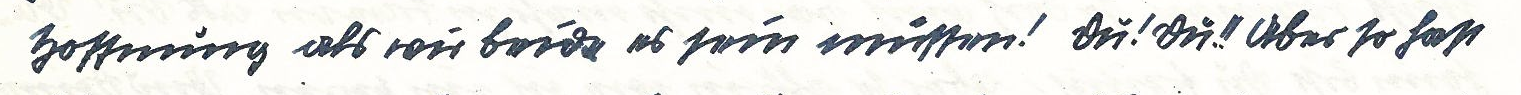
Hoffnung als wir beide es sein müssen! Du! Du!! Aber so hast
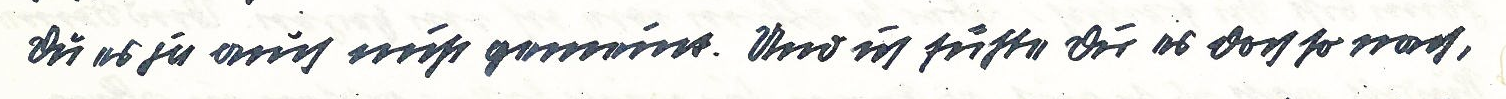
Du es ja auch nicht gemeint. Und ich fühle Dir es doch so nach,
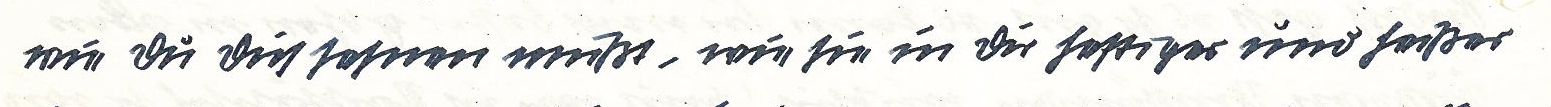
wie Du Dich sehnen mußt, wie sie in Dir heftiger und heißer
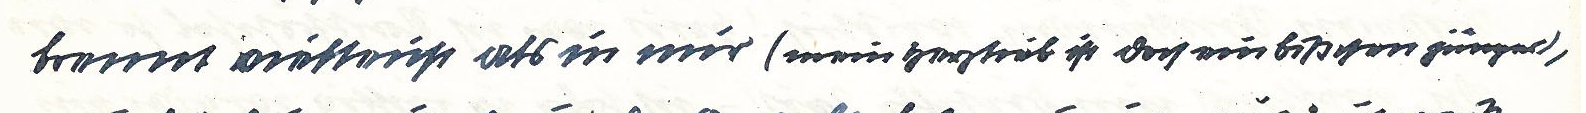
brennt vielleicht als in mir (mein Herzlieb ist doch ein bißchen jünger),
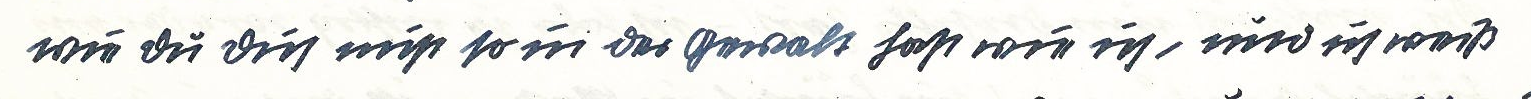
wie Du Dich nicht so in der Gewalt hast wie ich, und ich weiß
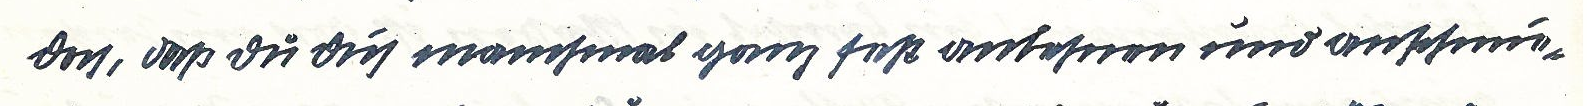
doch, daß Du Dich manchmal ganz fest anlehnen und anschmie¬
